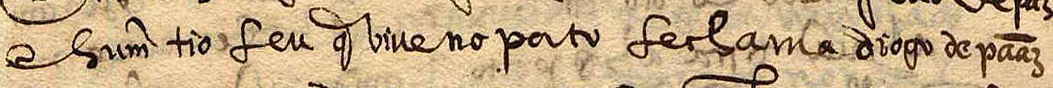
e hum̄ tio seu q̄ viue no porto se chama diogo de pāaz
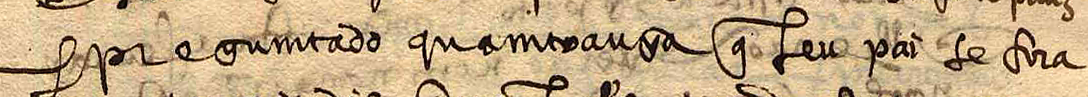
+ pregumtado quamto auya q̄ seu pai se fora
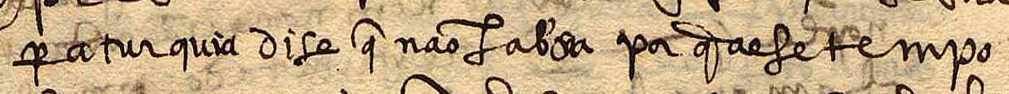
ꝑa turquia dise q̅ naõ sabya porq̄ a ese tempo
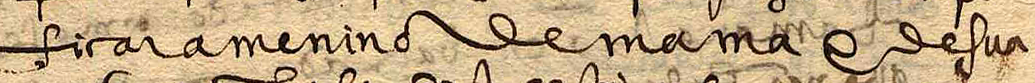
ficara menino de mama e de sua
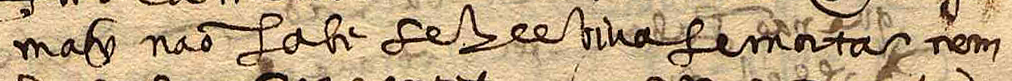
may naõ sabe se hee viua se morta nem
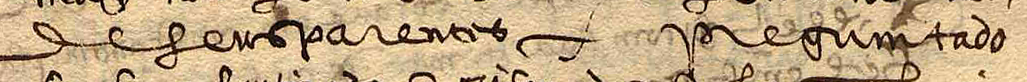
de seus parentes + pregumtado
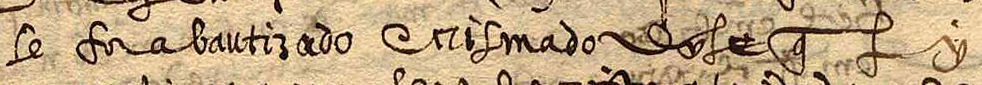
se fora bautizado e crismado dyse q̄ sy
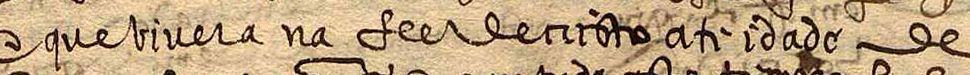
e que viuera na fee de cristo ate idade de
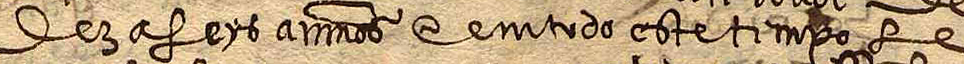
dezaseys ann̄os e em todo este tempo se
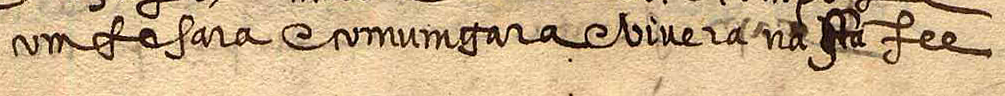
comfesara e comumgara e viuera na sta fee
